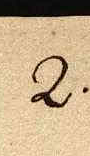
2.
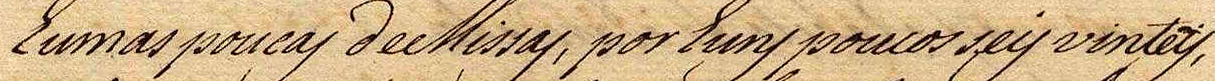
humas poucas de Missas, por huns poucos seis vinteis,
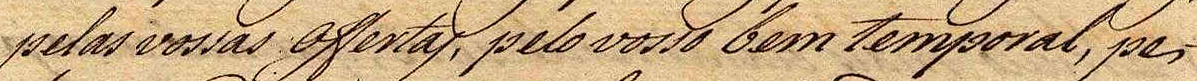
pelas vossas Offertas, pelo vosso bem temporal, pe
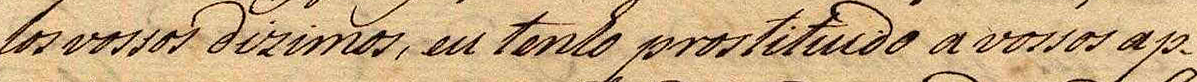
los vossos dizimos, eu tenho prostituido a vossos ap
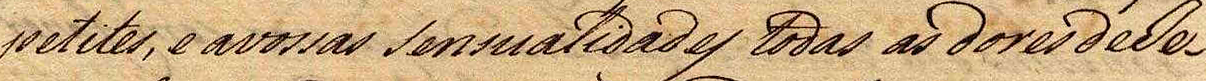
petites, e a vossas sensualidades todas as dores de Ie
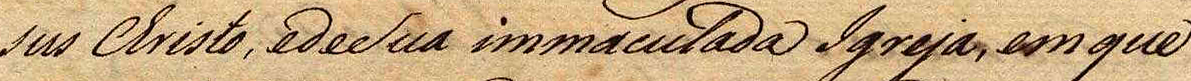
sus Christo, e de Sua immaculada Igreja, em que
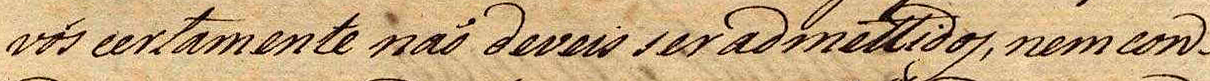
vós certamente naõ deveis ser admettidos, nem con
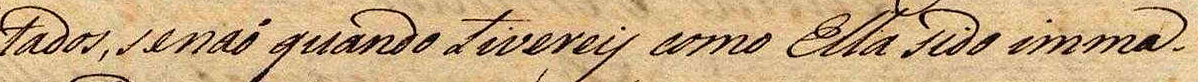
tados, senaõ quando tivereis como Ella sido imma
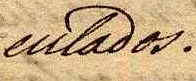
culados.
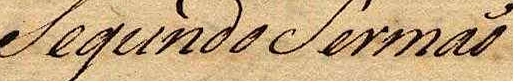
Segundo Sermaõ
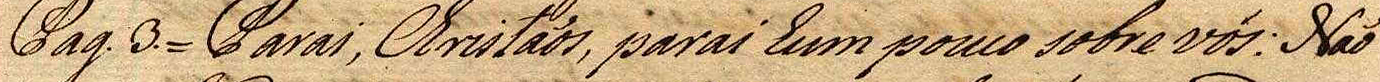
Pag. 3. = Parai, Christaõs, parai hum pouco sobre vós: Não
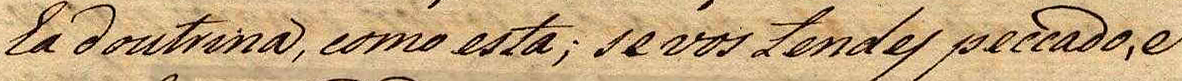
ha doutrina, como esta; se vos tendes peccado, e
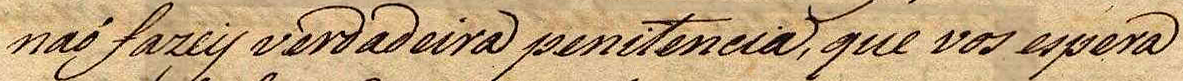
naõ fazeis verdadeira penitencia, que vos espera
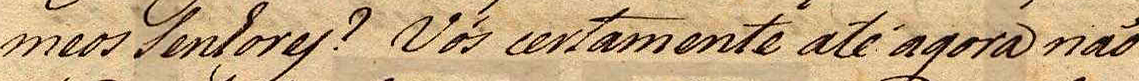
meos Senhores? Vós certamente até agora naõ
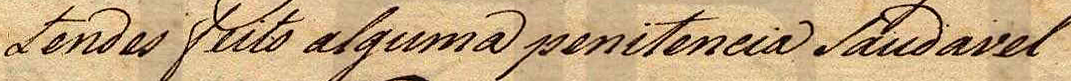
tendes feito alguma penitencia Saudavel
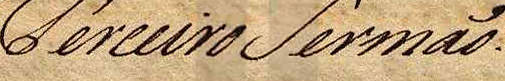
Terceiro Sermaõ
